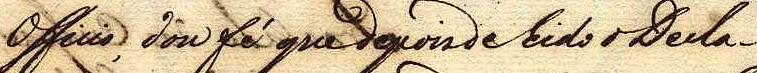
Officio, dou fé que depois de hido o Decla
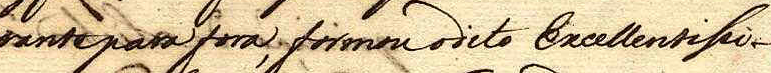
rante para fora formou o dito Excellentissi
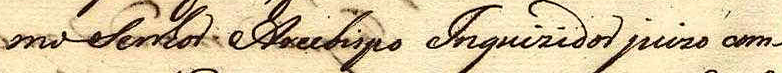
mo Senhor Arcebispo Inquizidor juizo com
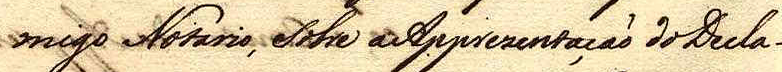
migo Notario, Sobre a Apprezentaçaõ do Decla
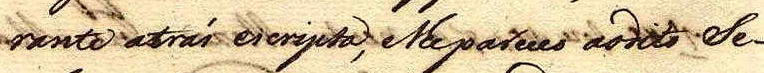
rante atrás escripto, e lhe pareceo ao dito Se
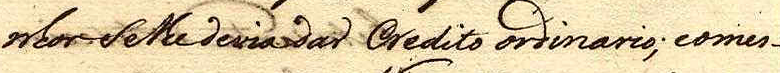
nhor Se lhe devia dar Credito ordinario; e o mes
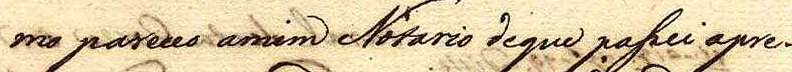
mo pareceo a mim Notario de que passei a pre
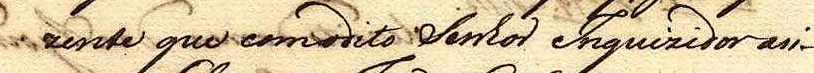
zente que com o dito Senhor Inquizidor asi
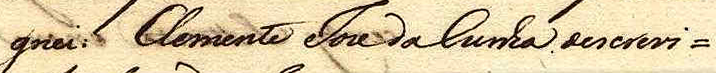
gnei: Clemente Ioze da Cunha o escrevi
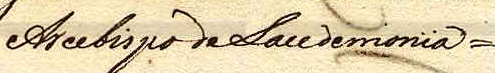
Arcebispo de Lacedemonia=
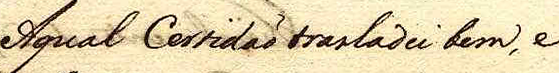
A qual Certidaõ trasladei bem, e
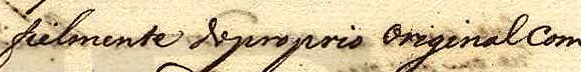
fielmente do proprio original com
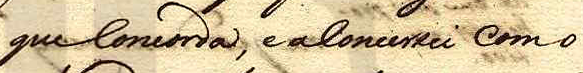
que Concorda, e a Concertei Com o
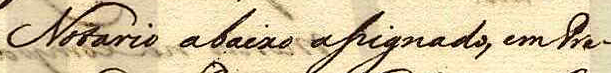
Notario abaixo assignado, em Pre
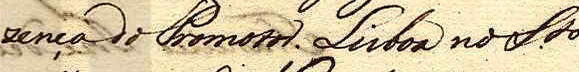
zença do Promotor. Lisboa no S.to
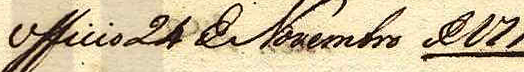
Officio 24 d̄ Novembro d̄ 1779
